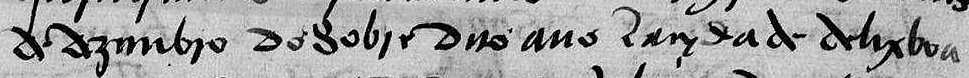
de dezembro do Sobredito ano ē a cydade de lixboa
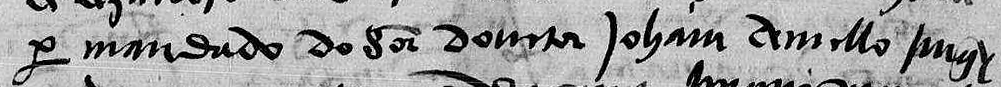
ꝑ mandado do Sōr Douctor Joham de mello Jmq̄y
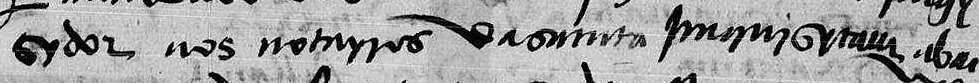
sydor nos notayros da samta Jmqujsyçam abai
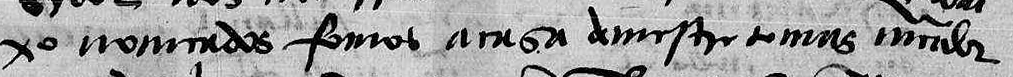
xo nomeados fomos a casa de mestre tomas m̄cador
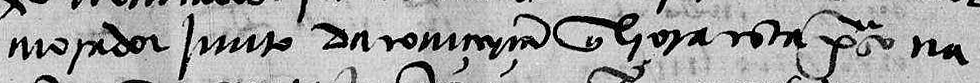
morador Junto da comceyçā q̄ hora esta p̄so na
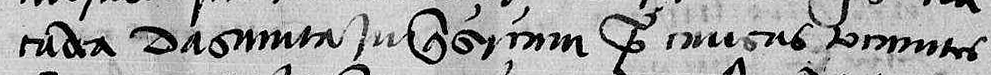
cadea Da samta Jmq̄syçam p̄o causas tocamtes
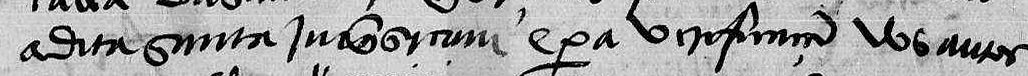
a dita santa Jmq̄syçam e ꝑa verificaçā dos autos
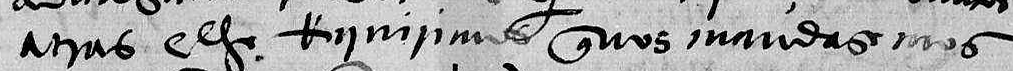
atras e lhe Requirimos q̄ nos mandasemos
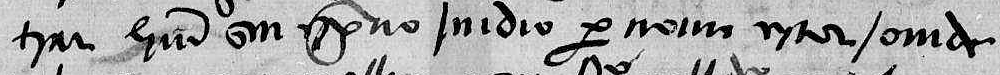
trar huū seu esp̄uo Jmdio ꝑ nome eytor / omde
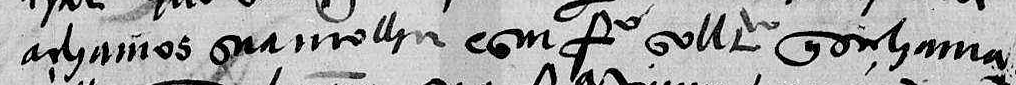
achamos sua molher e seu fo solltro q̄ se chama
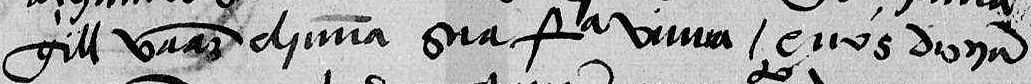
gill vāaz e huūa sua fa viuua / e nos diserā
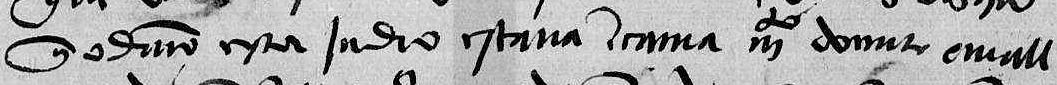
q̄ o ditto eytor Jndio estaua ē cama mto doemte e mall
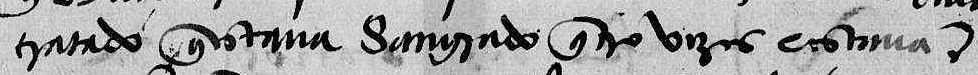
tratado q̄ estaua Sangrado q̄tro vezes e estaua ē
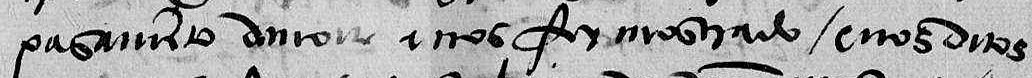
pasamēto de morte e nos foy mostrado / e nos ditos
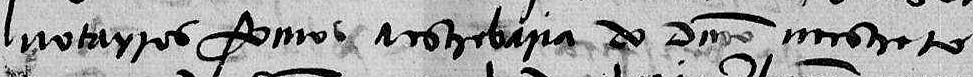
notayros fomos a estrebaria do ditto mestre to
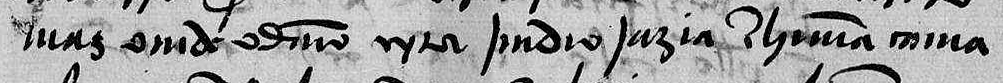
mas omde o ditto eytor Jmdio Jazia ē huūa cama
